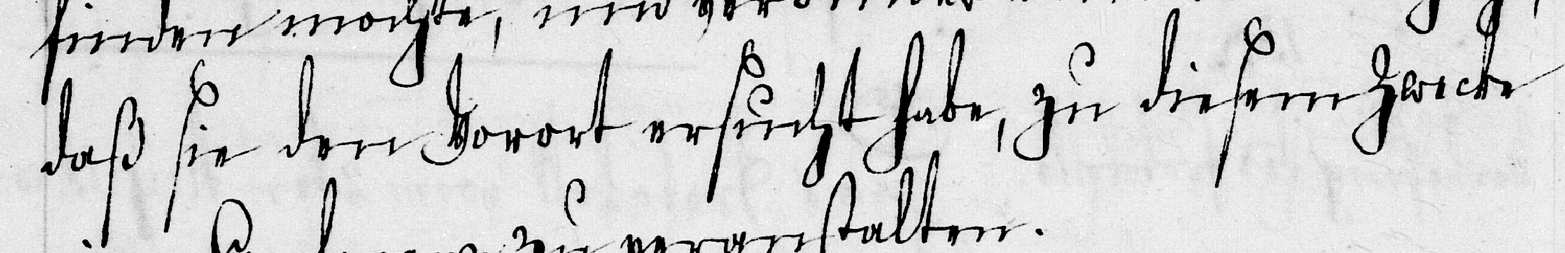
daß sie den Vorort ersucht habe, zu diesem Zwecke
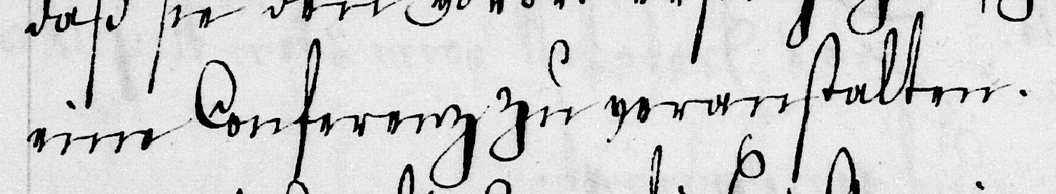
eine Conferenz zu veranstalten.
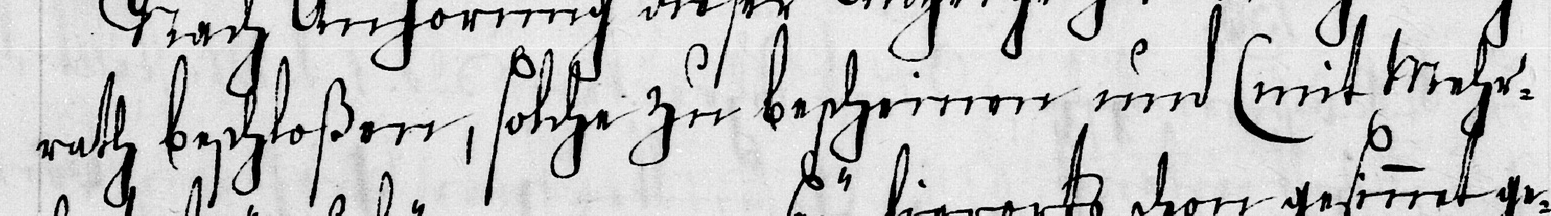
rath beschloßen, solche zu bescheinen und (mit Mehr¬
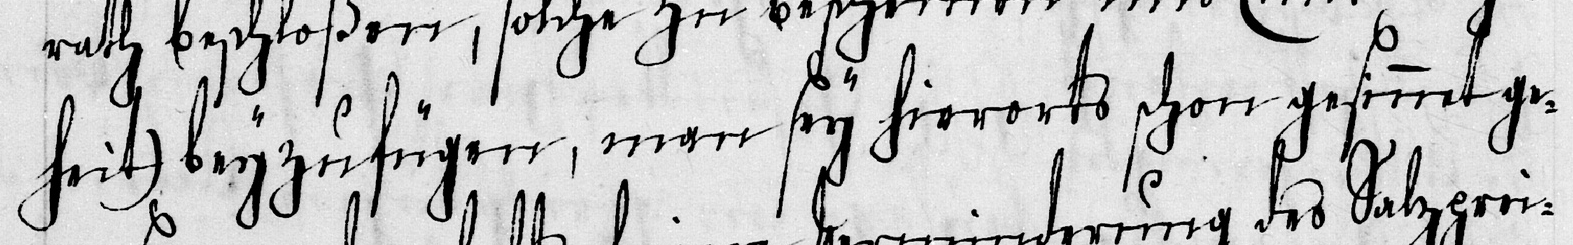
heit) beyzufügen, man sey hierorts schon gesinnt ge¬
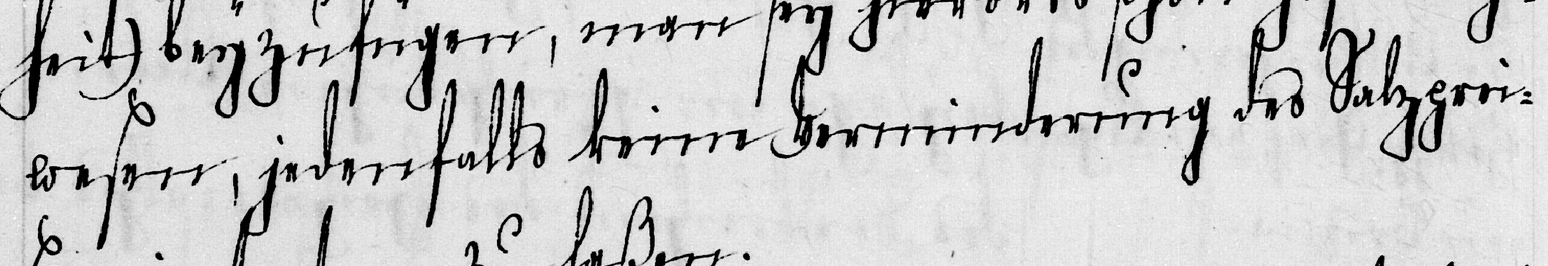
wesen, jedenfalls keine Verminderung des Salzprei¬
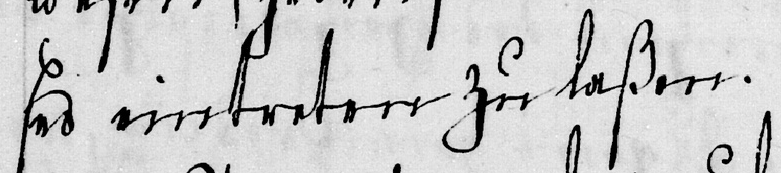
ses eintreten zu laßen.
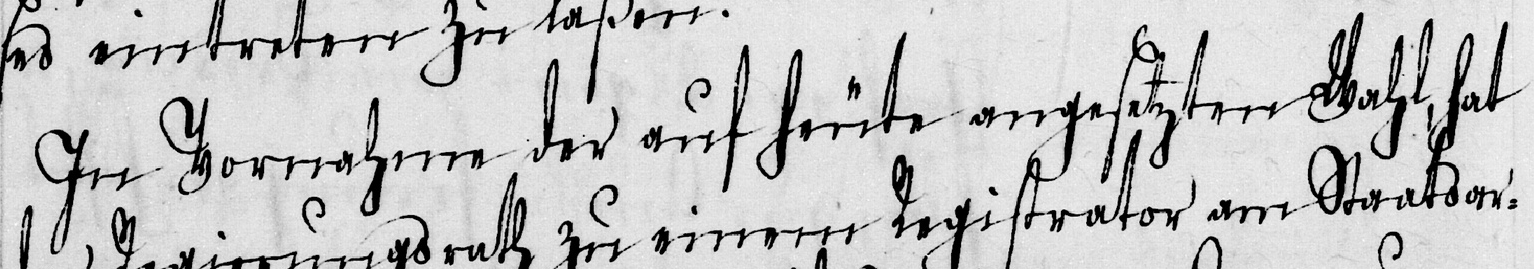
In Vornahme der auf heute angesetzten Wahl, hat
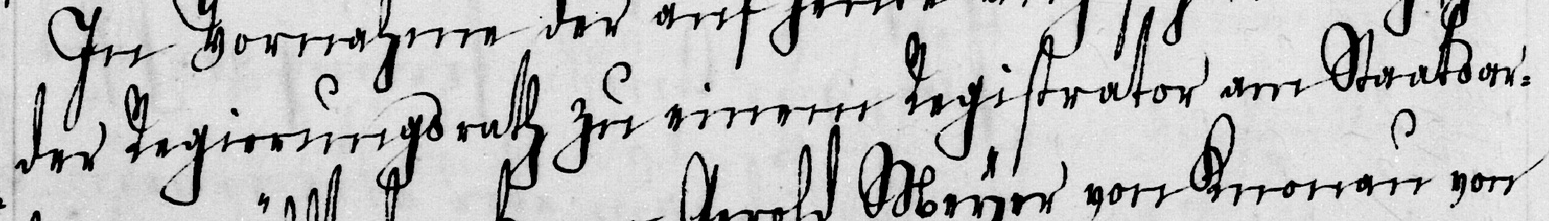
der Regierungsrath zu einem Registrator am Staatsar¬
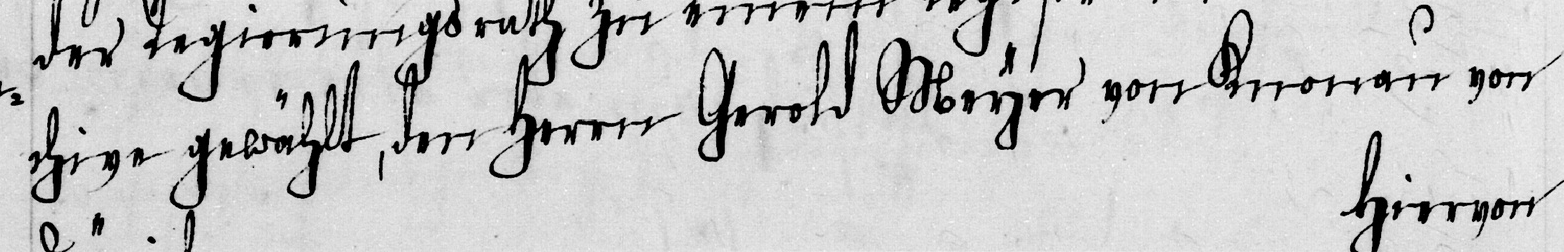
chive gewählt, den Herrn Gerold Meyer von Knonau von
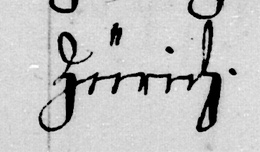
Zürich.
